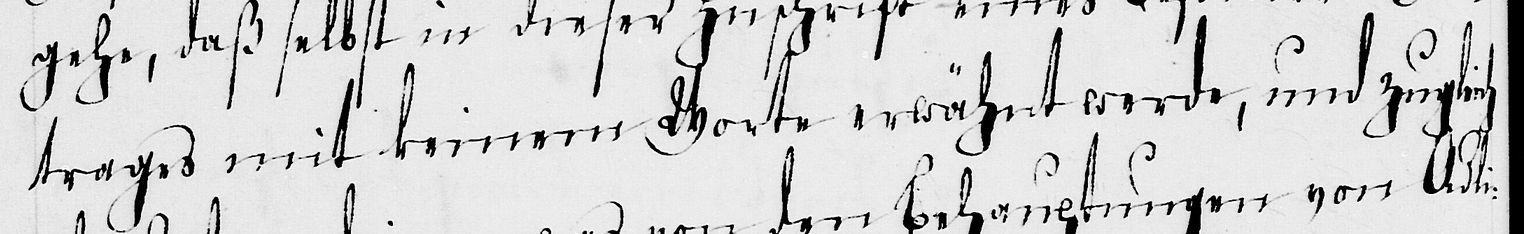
trages mit keinem Worte erwähnt werde, und zuglei¬
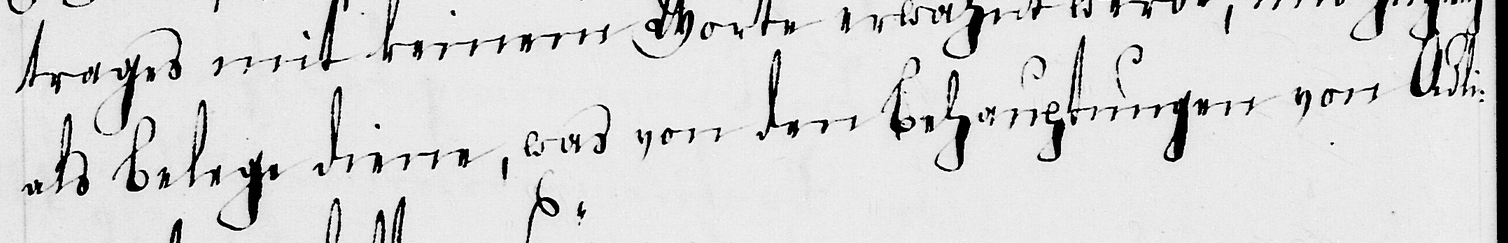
als Belege diene, was von den Behauptungen von Adli¬
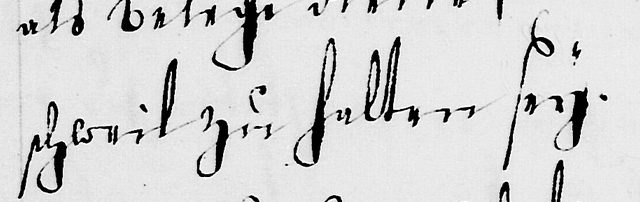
schweil zu halten sey.
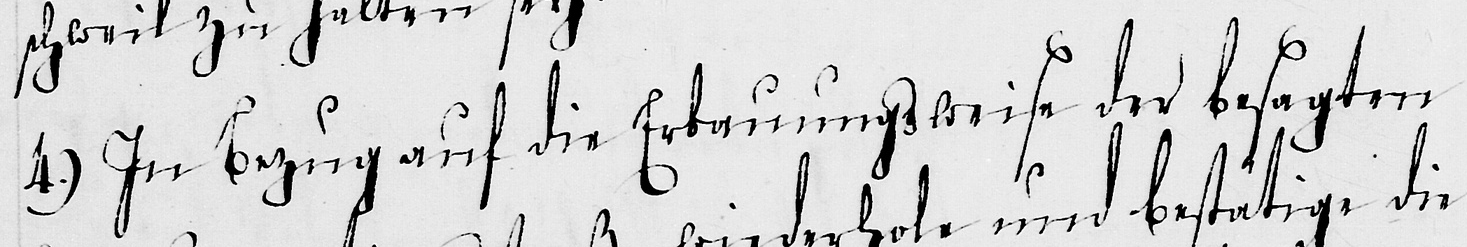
4.) In Bezug auf die Erbauungsweise der besagten
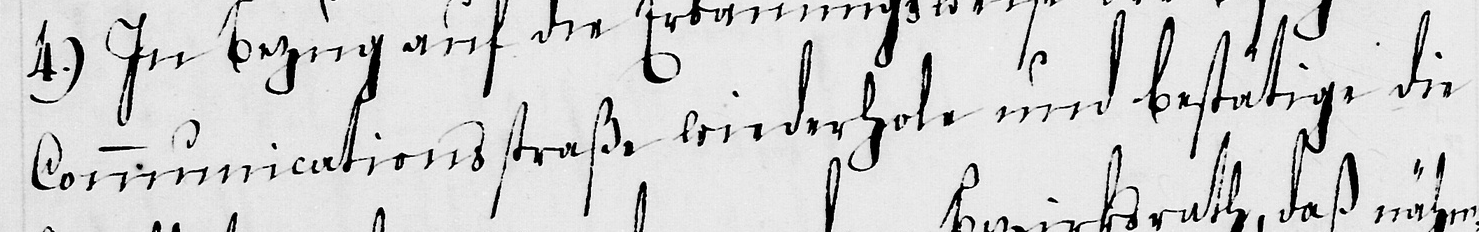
Communicationsstraße wiederhole und bestätige die
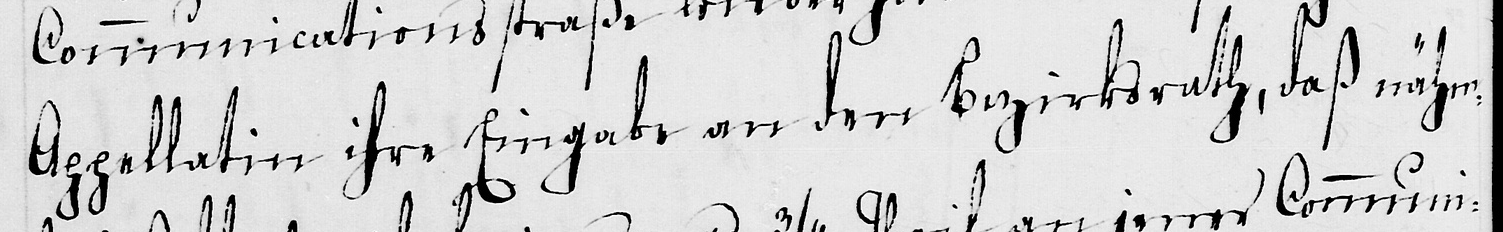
Appellatin ihre Eingabe an den Bezirksrath, daß nähm¬
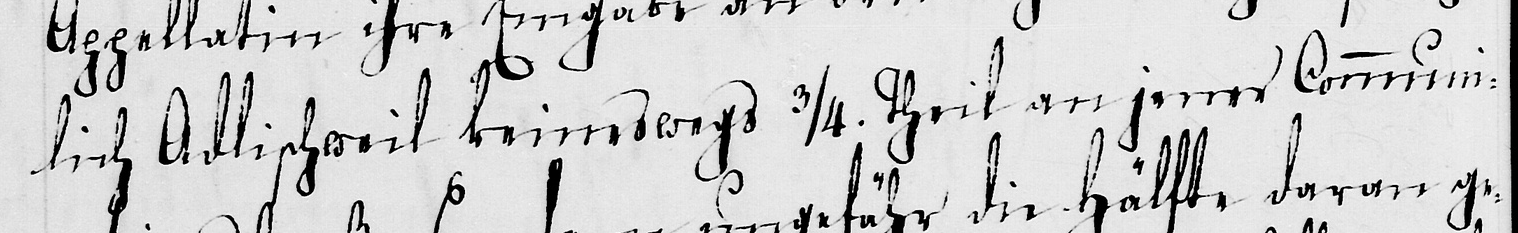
lich Adlischweil keineswegs ¾. Theil an jener Communi¬
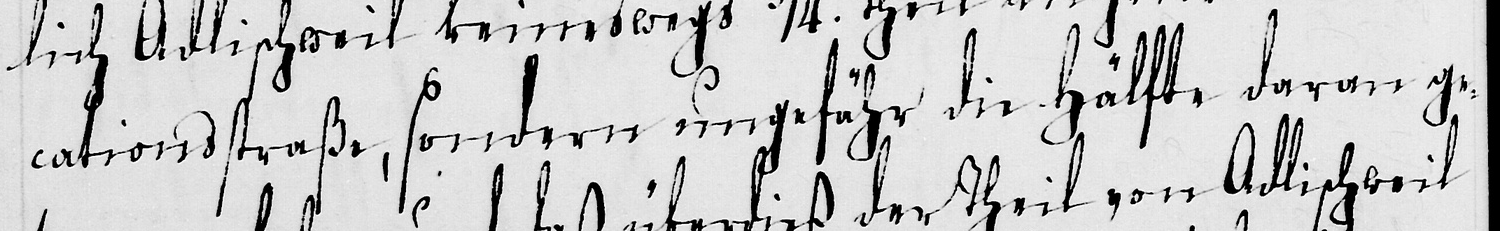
cationsstraße, sondern ungefähr die Hälfte daran ge¬
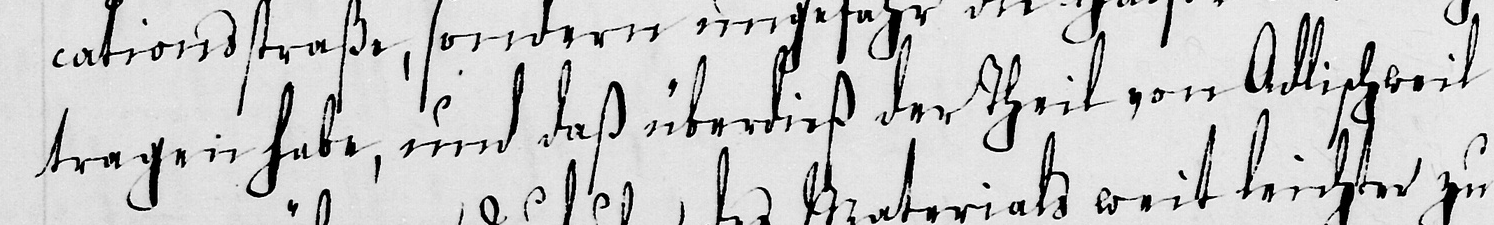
tragen habe, und daß überdieß der Theil von Adlischweil
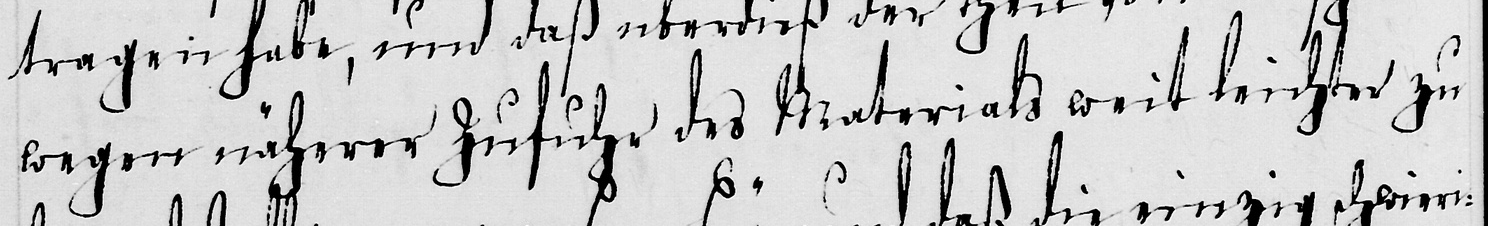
wegen näherer Zufuhr des Materials weit leichter zu
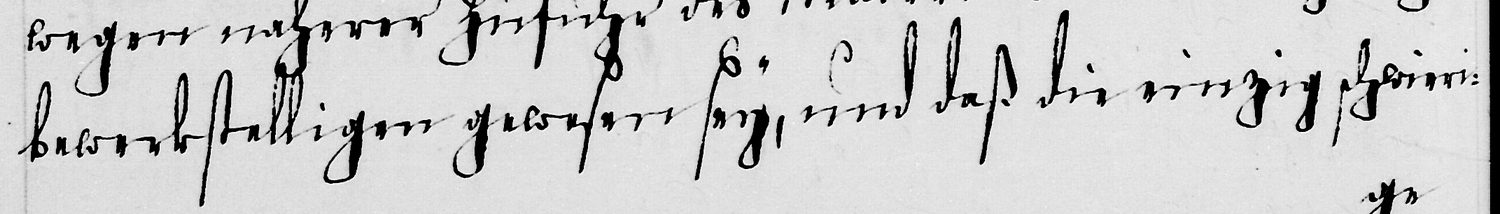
bewerkstelligen gewesen sey, und daß die einzig schwieri-
